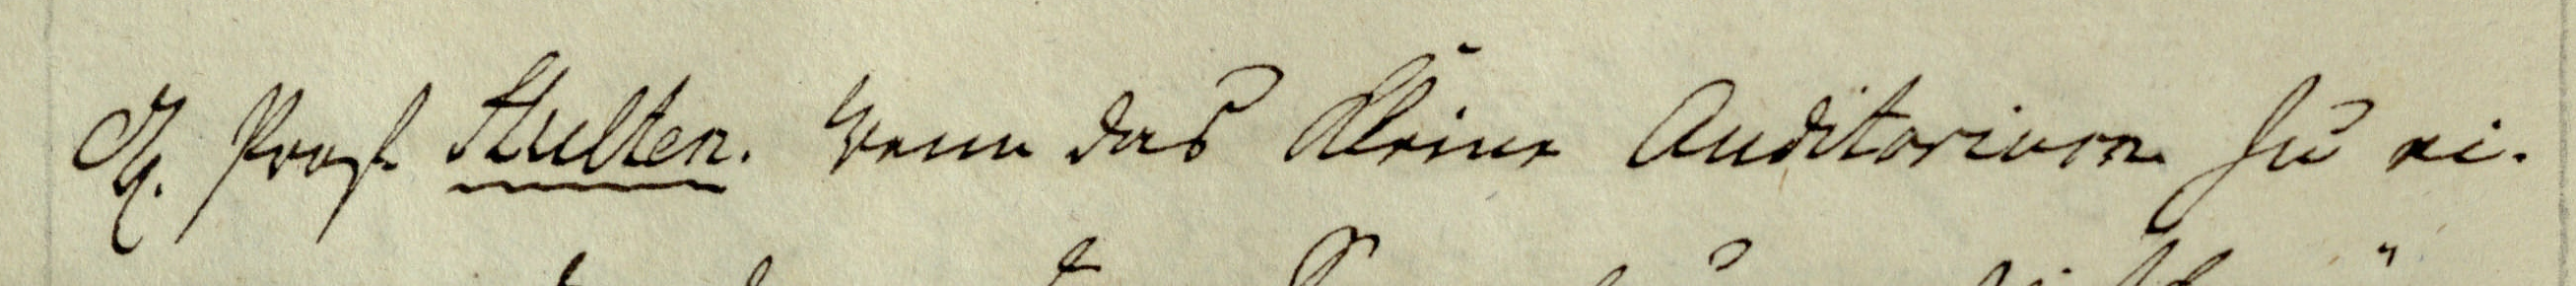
dh. Prof. Hulten. Wenn das kleine Auditorium zu ei¬
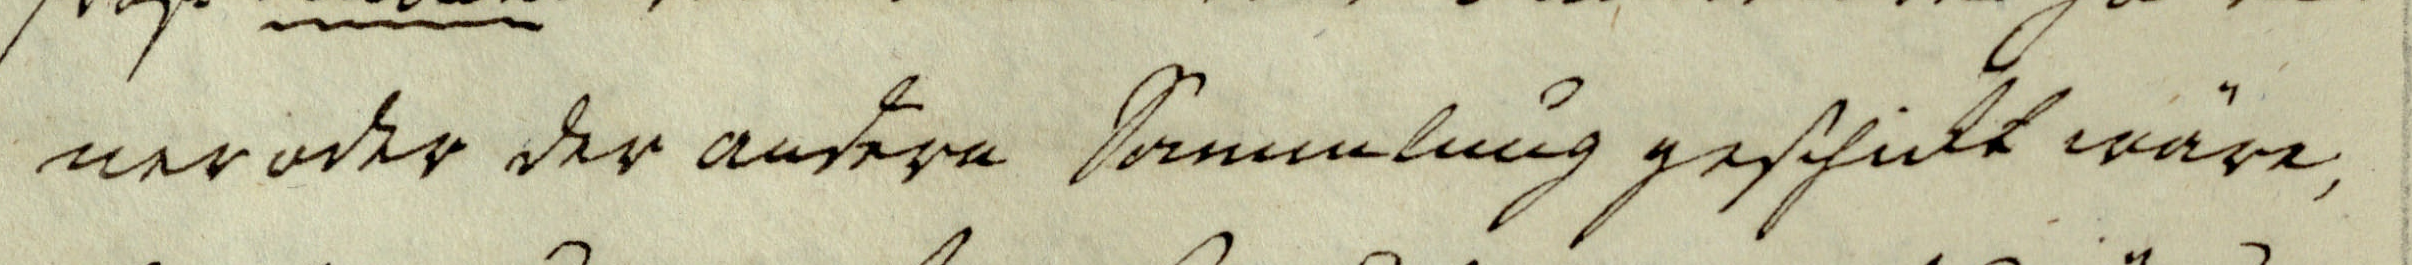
ner oder der andern Sammlung geschickt wäre,
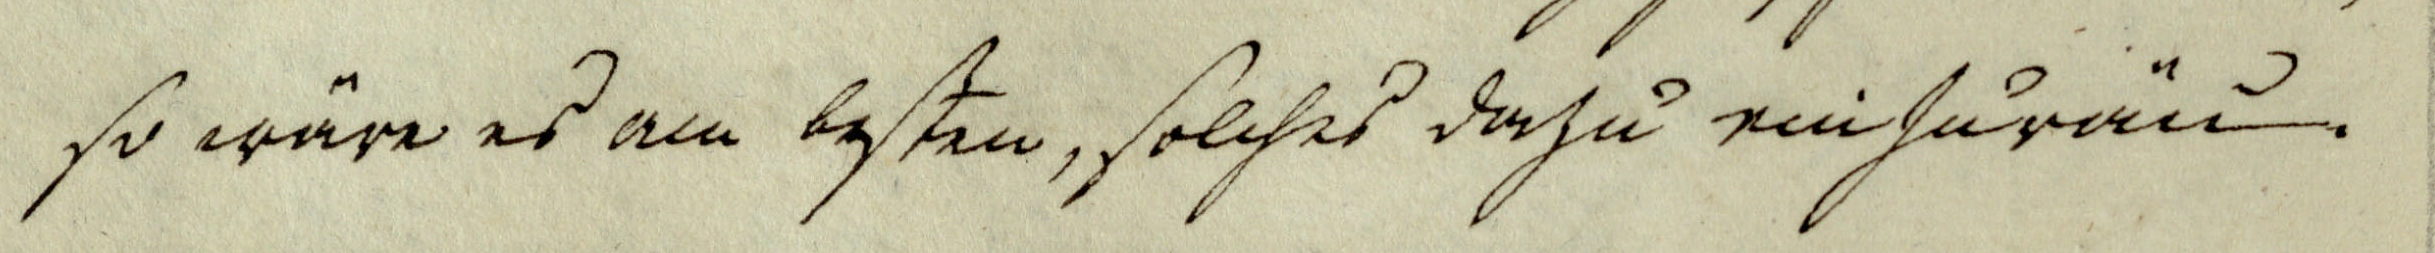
so wäre es am besten, solches dazu einzuräu¬
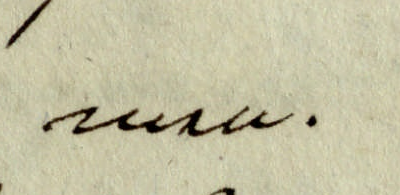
men.
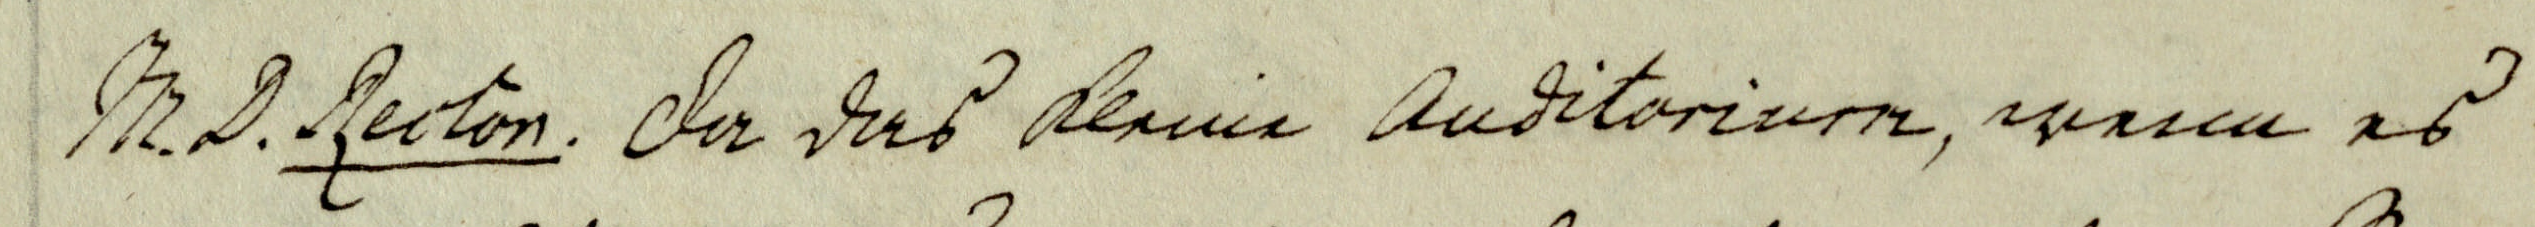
M. D. Rector. Da das kleine Auditorium, wenn es
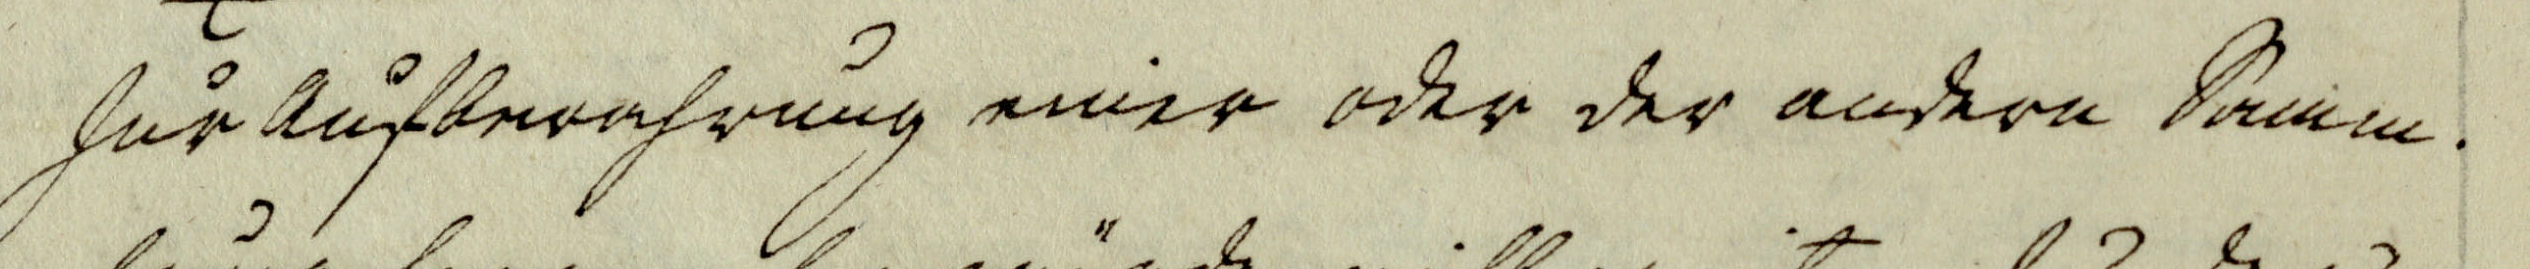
zur Aufbewahrung einer oder der andern Samm¬
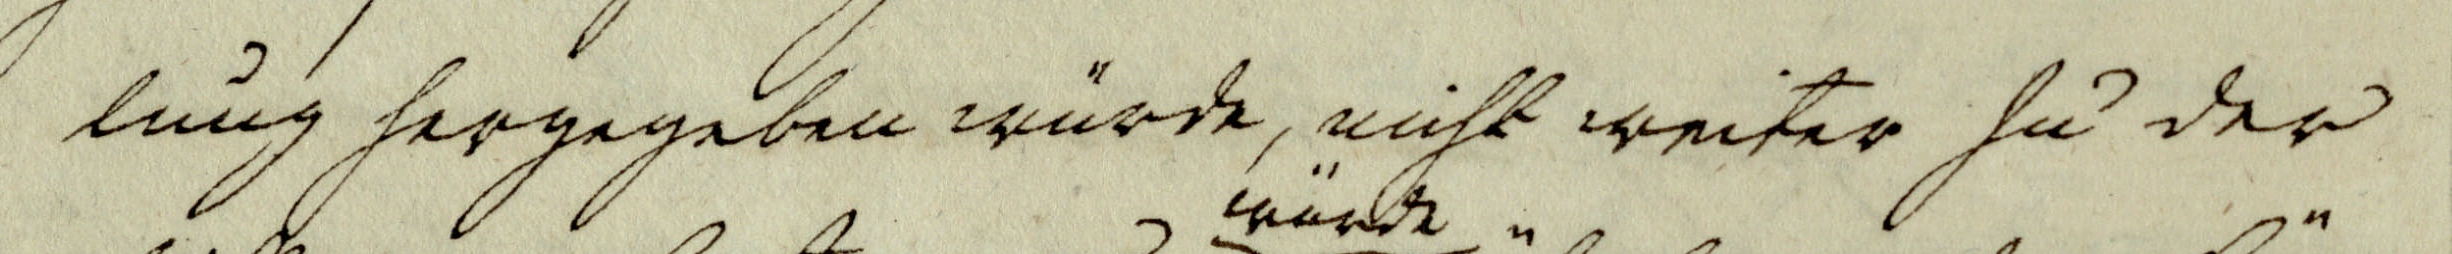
lung hergegeben würde, nicht weiter zu der
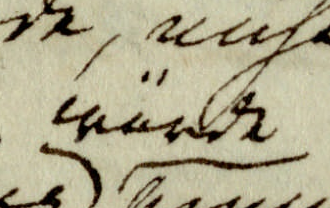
würde
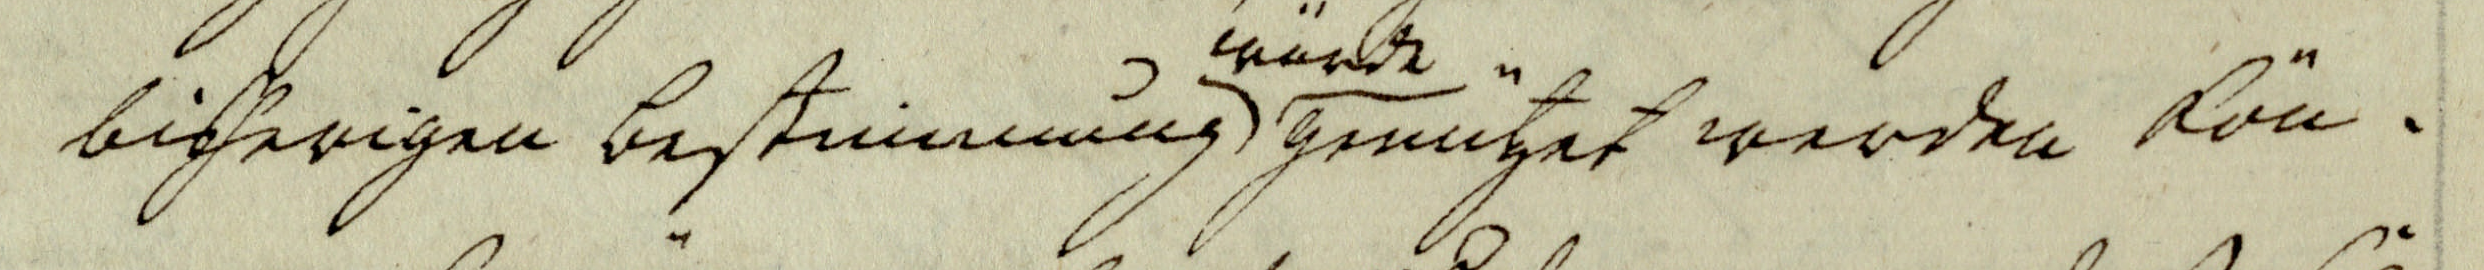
bisherigen Bestimmung genützet werden kön¬
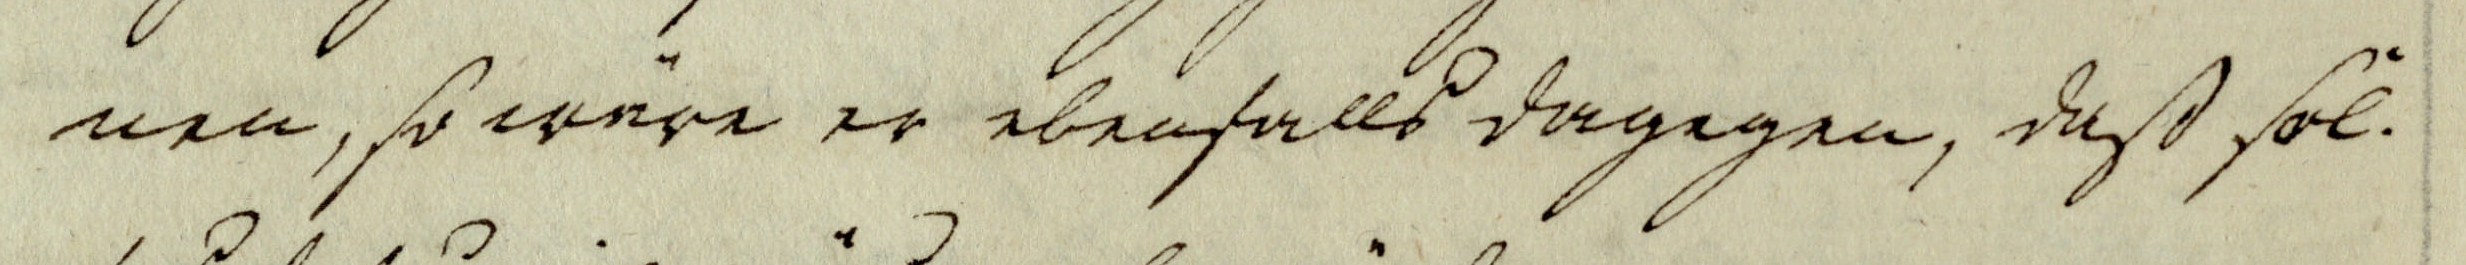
nen, so wäre er ebenfalls dagegen, daß sol¬
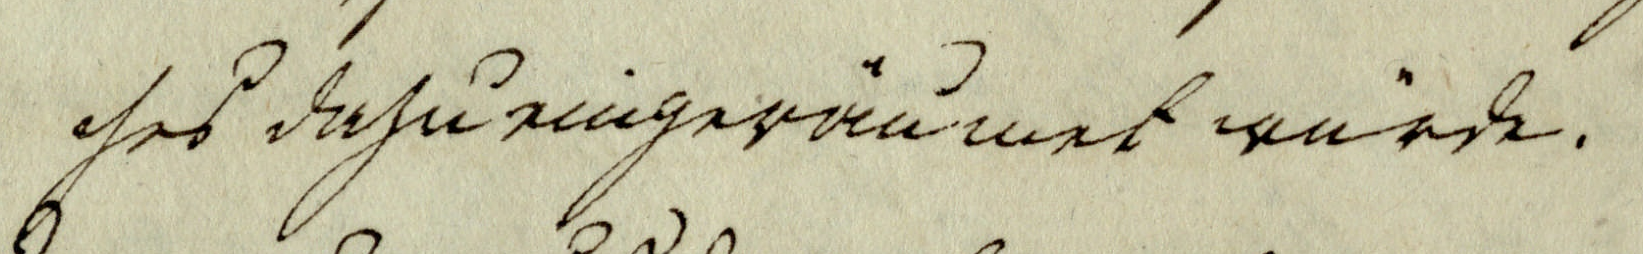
ches dazu eingeräumet würde.
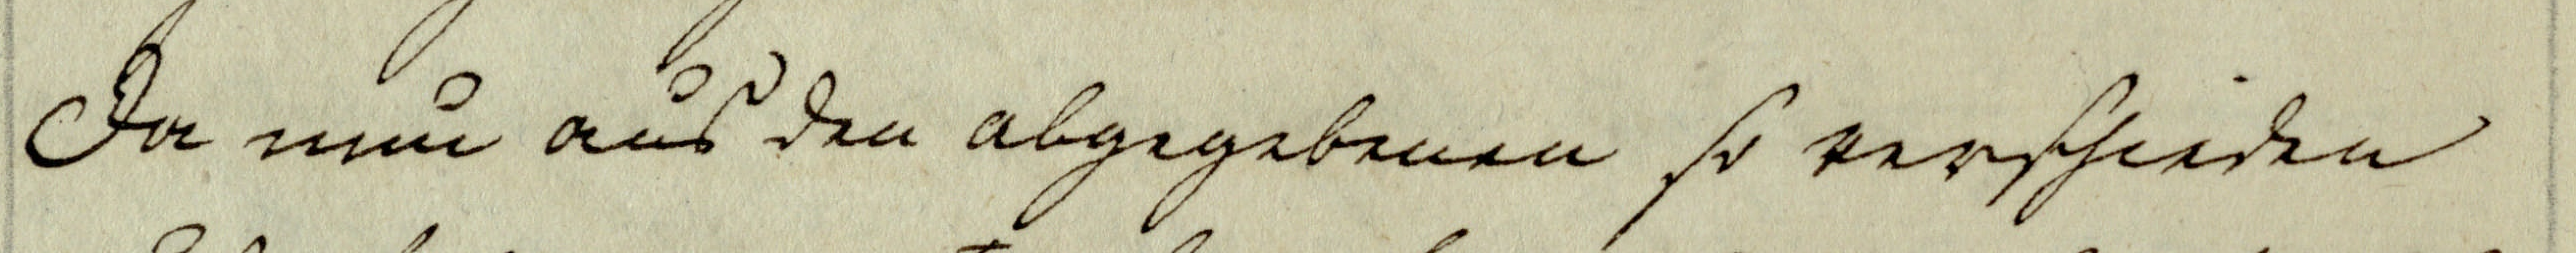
Da nun aus den abgegebenen so verschieden
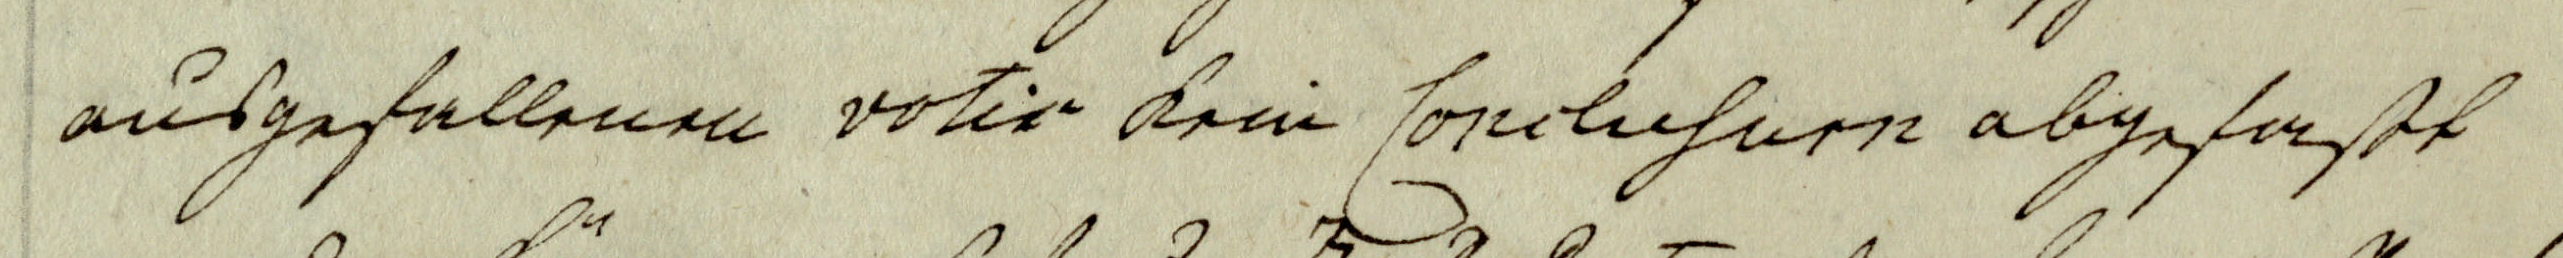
ausgefallenen votis kein Conclusum abgefaßt
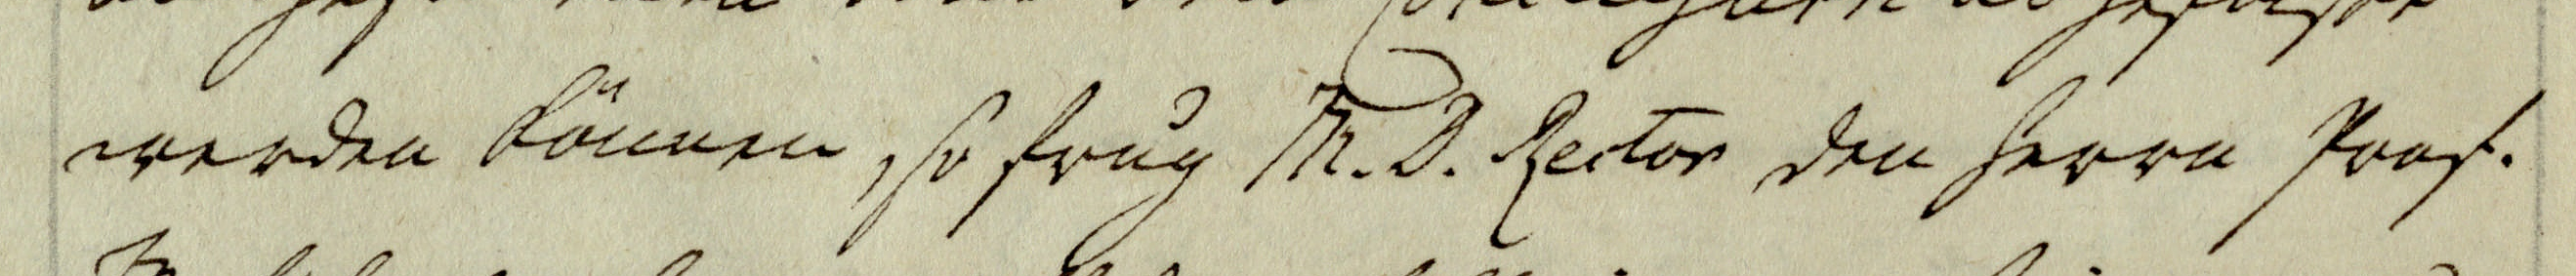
werden können, so frug M. D. Rector den Herrn Prof.
